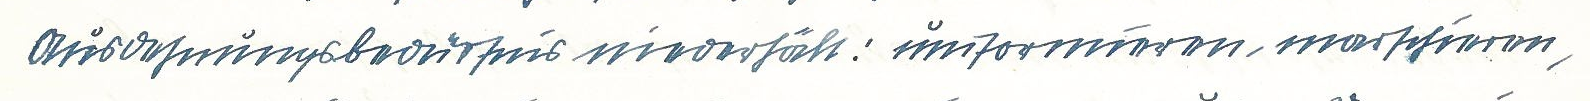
Ausdehnungsbedürfnis niederhält: uniformieren, marschieren,
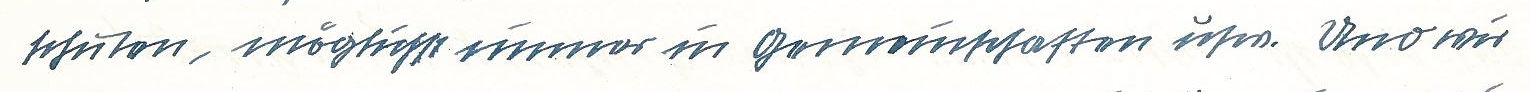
schulen, möglichst immer in Gemeinschaften usw. Und wir
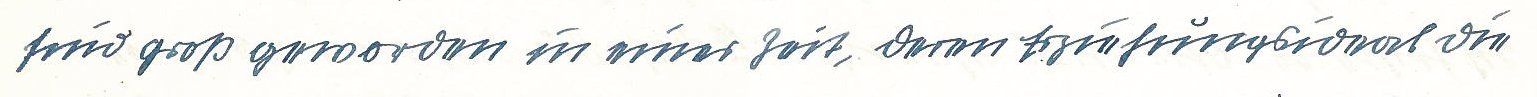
sind groß geworden in einer Zeit, deren Erziehungsideal die
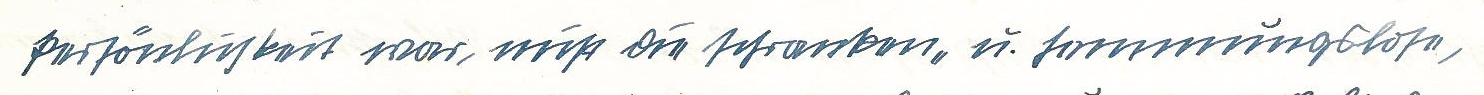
Persönlichkeit war, nicht die schranken- u. hemmungslose,
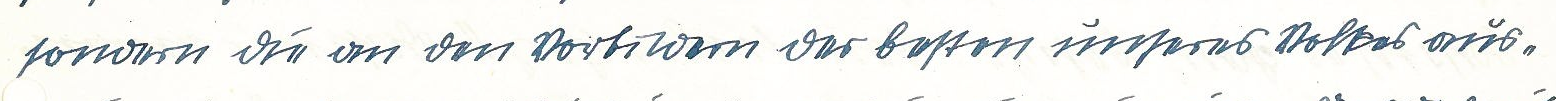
sondern die an den Vorbildern der besten unseres Volkes aus¬
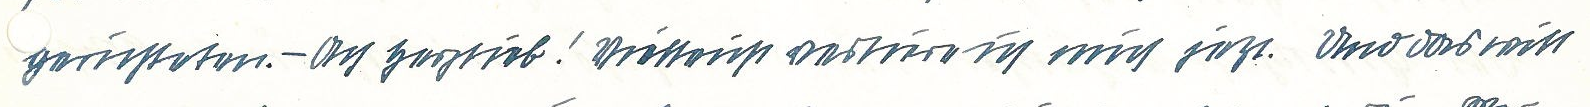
gerichteten. – Ach Herzlieb! Vielleicht verliere ich mich jetzt. Und das will
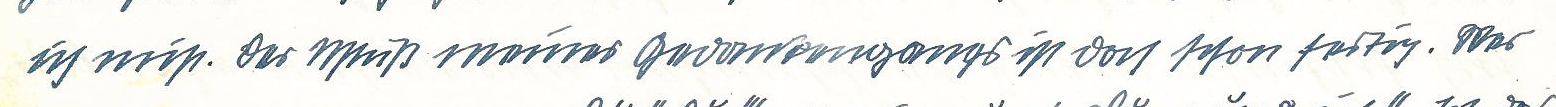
ich nicht. Der Schluß meines Gedankengangs ist doch schon fertig. Wer
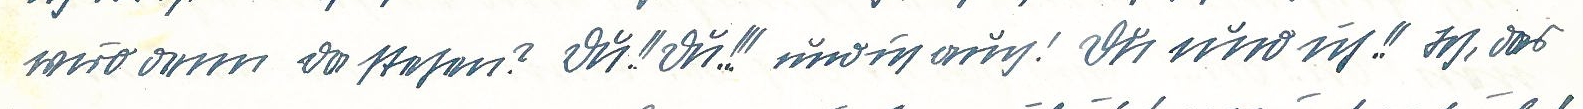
wird denn da stehen? Du!! Du!!! und ich auch! Du und ich!! Ich, das
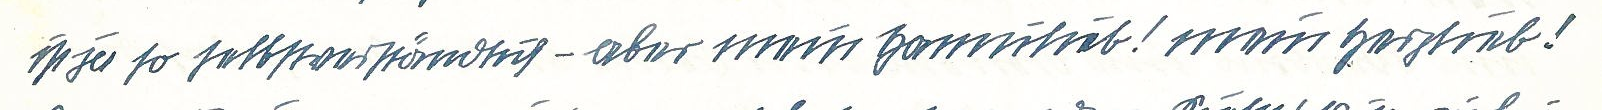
ist ja so selbstverständlich – aber mein lieb! Mein Herzlieb!!
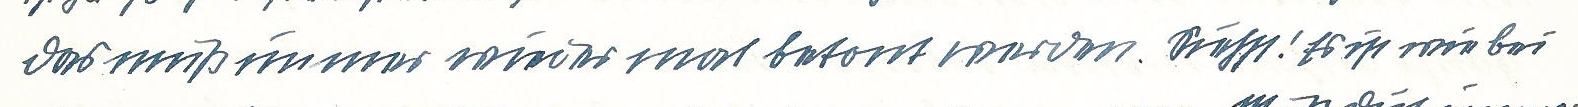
Das muß immer wieder mal betont werden. Siehst! Es ist wie bei
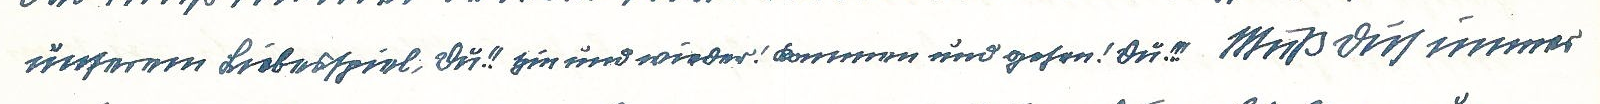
unserem Liebesspiel, Du!! Hin und wieder! Kommen und Gehen! Du!!! Muß Dich immer
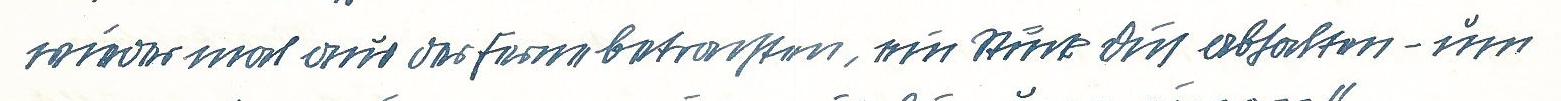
wieder mal aus der Ferne betrachten, ein Stück Dich abhalten – um
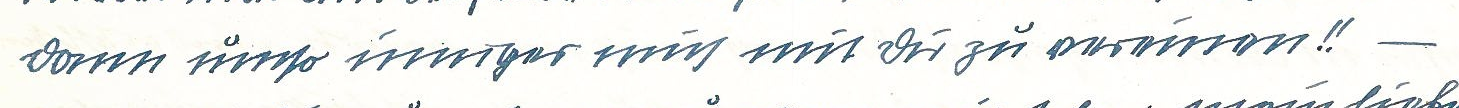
dann umso inniger mich mit Dir zu vereinen!! –
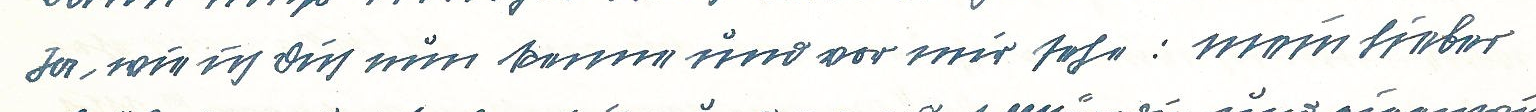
Ja, wie ich Dich nun kenne und vor mir sehe: mein lieber
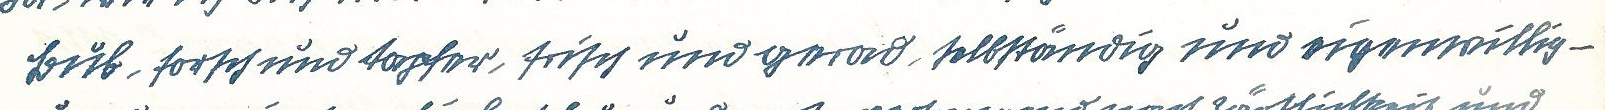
Bub, forsch und tapfer, frisch und gerad, selbständig und eigenwillig –
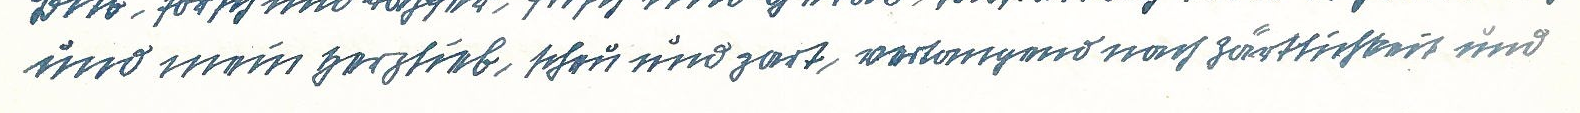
und mein Herzlieb, scheu und zart, verlangend nach Zärtlichkeit und
